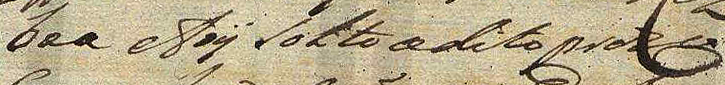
boa e foy solto o dito prezo
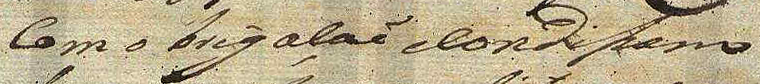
com obrigaçaõ e condissam
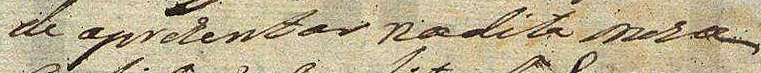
de aprezentar na dita meza
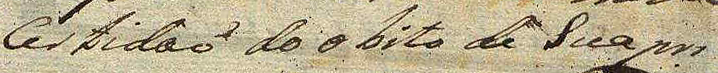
Certidaõ do obito de sua pri
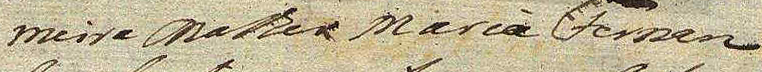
meira Molher Maria Fernan
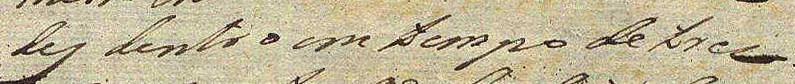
des dentro em tempo de tres
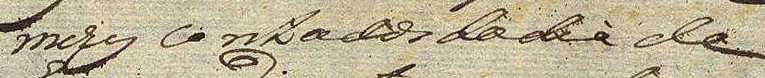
mezes contados do dia de
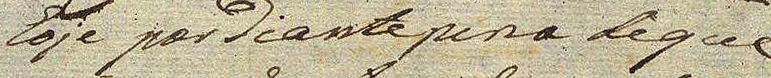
hoje por diante pena de que
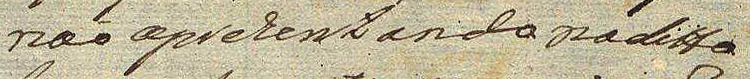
naõ aprezentando no ditto
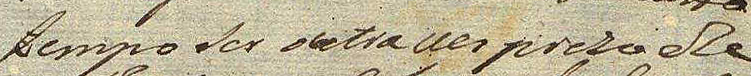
tempo ser outra ues prezo e Re
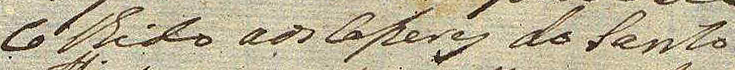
colhido aos Casseres do Santo
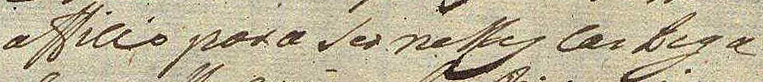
officio para ser nelles castiga
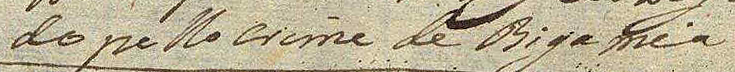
do pello crime de Bigamia
